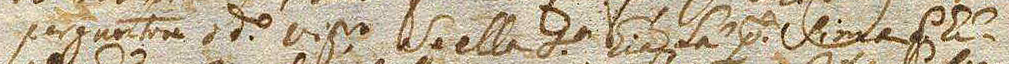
perguntou o d.o vigr.o Se elle t.a hia Lá p.a Sima q̄ hé
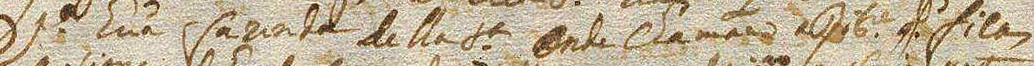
p.a huā fazenda della t.a onde chamam a Rib.ra q̄ fica
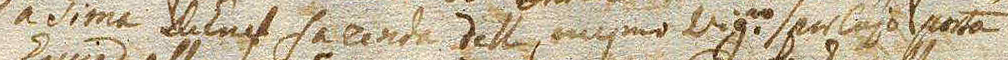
asima de huaꝭ fazenda delle mesmo Vig.ro por cujo porta
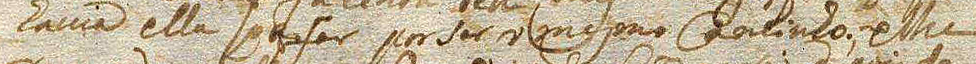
hauia ella pasar por ser o mesmo Caminho; e lhe
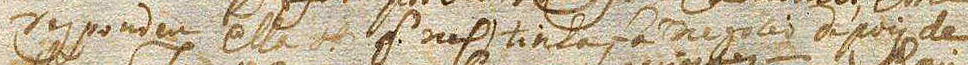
respondeu ella t.a q̄. naõ tinha Lá negocio depois de
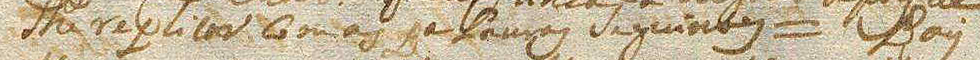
lhe replicar com as palauras seguintes = Vay
